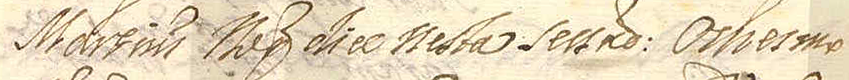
Martin̄s No q̄ dice nesta sessão: O mesmo
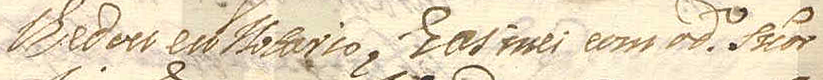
lhe dou eu Notario, E asinei com o d.o Sn̄or
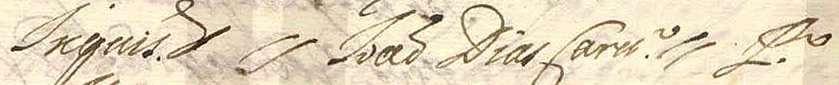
Inquis.or // Ioão Dias Caru.o // P.o
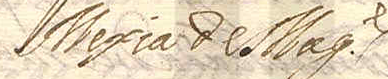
Mexia de Mag.es
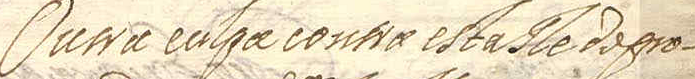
Outra culpa contra esta Re do pro
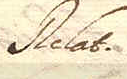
Relat.
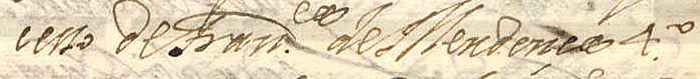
cesso de Francisca de Mendonça 4.o
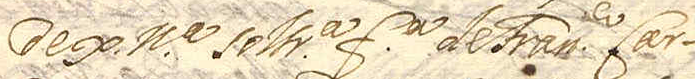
de x. n.a soltr.a f.a de Fran.co Cor
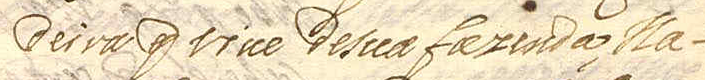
deira q̄ viue de sua fazenda, Na
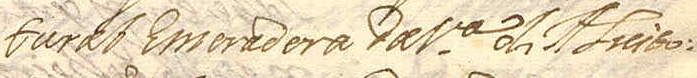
tural e moradora da V.a de Aluito:
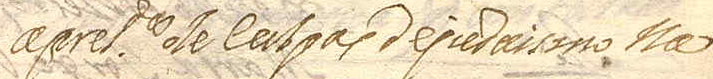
apres.dos de Culpas de judaismo Na
